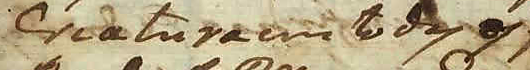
Creatura em todas as
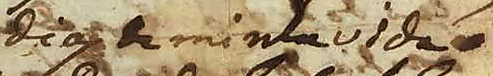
dias de minha vida
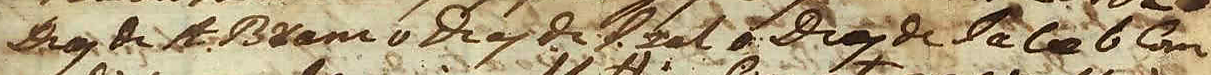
Deos de A. Bram o Deos de I.zal o Deos de IaCob Com
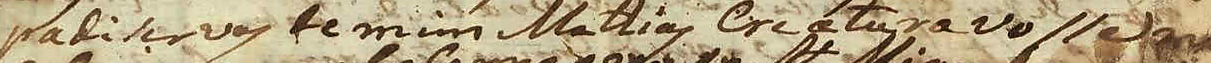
padiservos de mim Mattias Creatura vossa ma
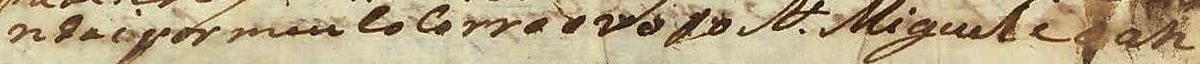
ndai por meu CoCorro o voso et̄. Miguel e o an
